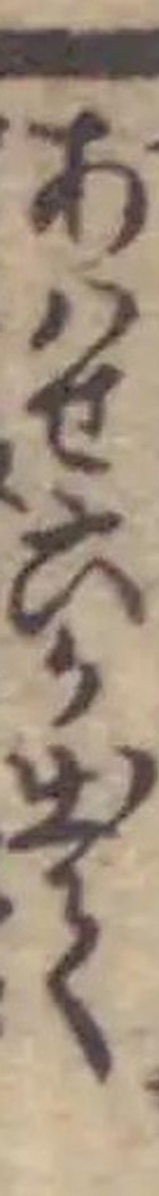あはせ六か出て
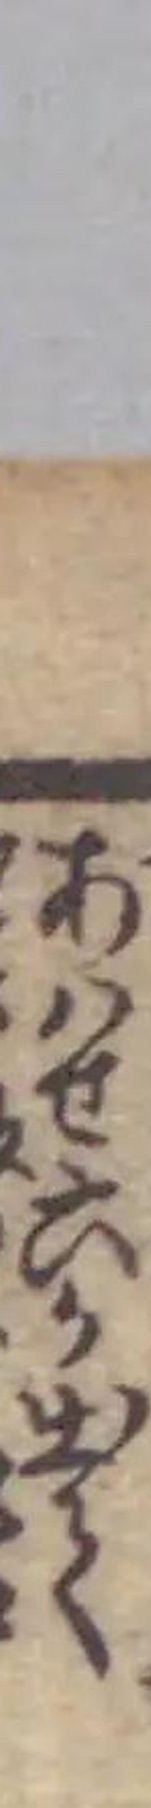あはせ六か出て
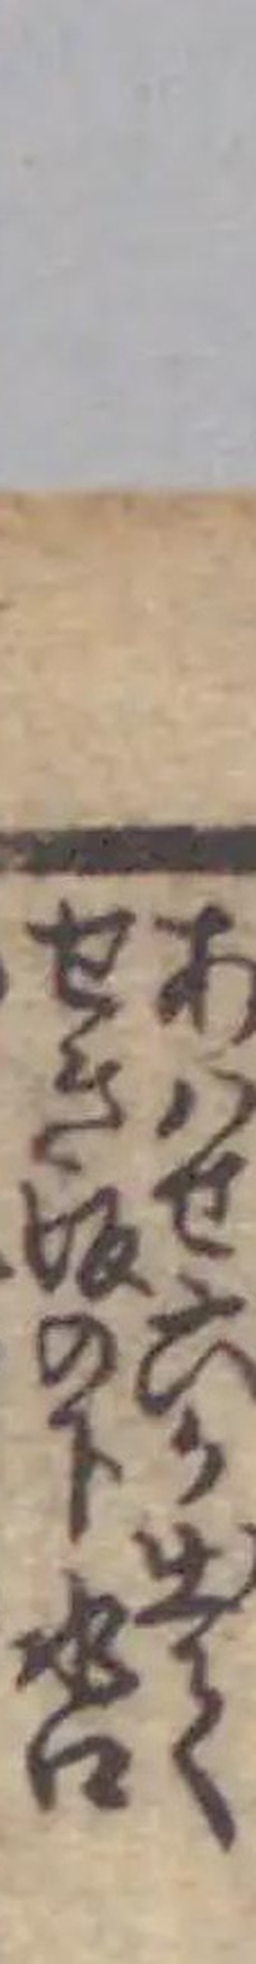せき坂の下水口
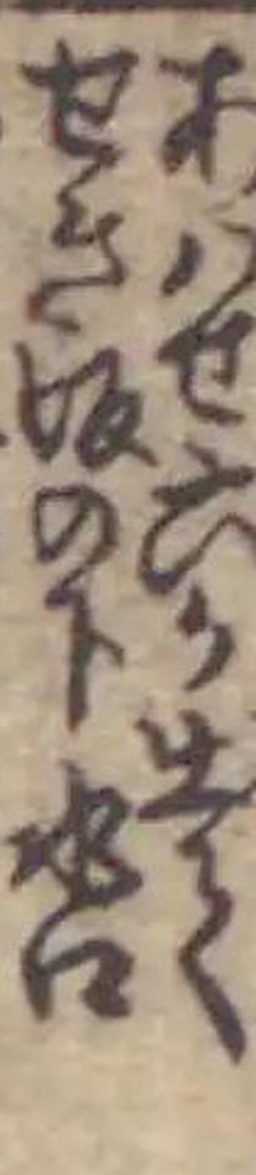せき坂の下水口
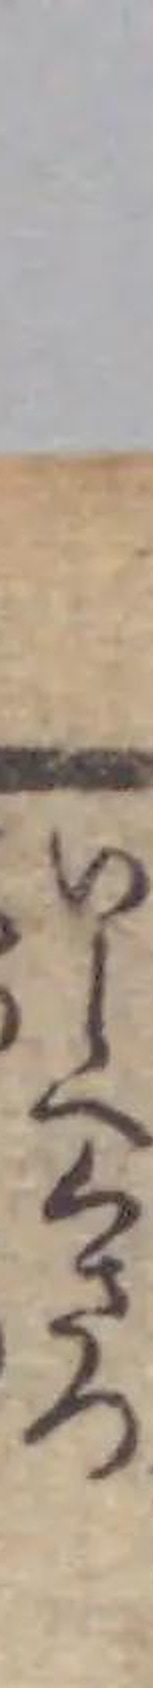いしへくさつ
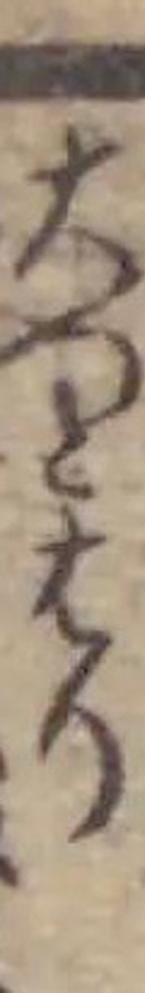大つとはり
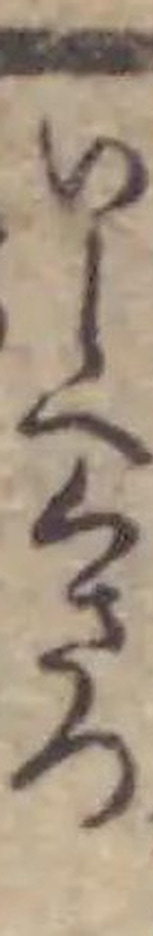いしへくさつ
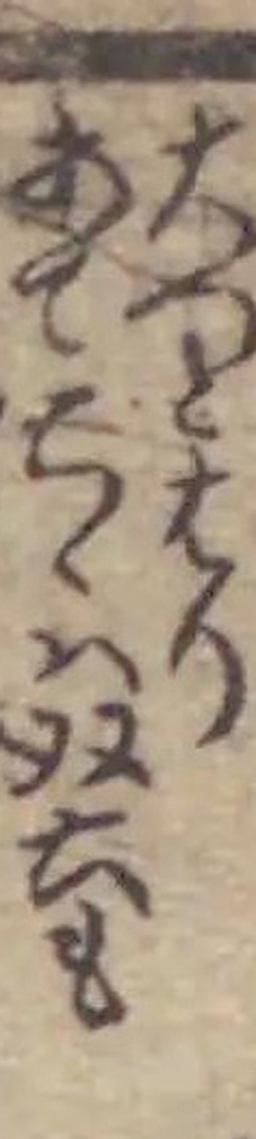あてこゝは双六も
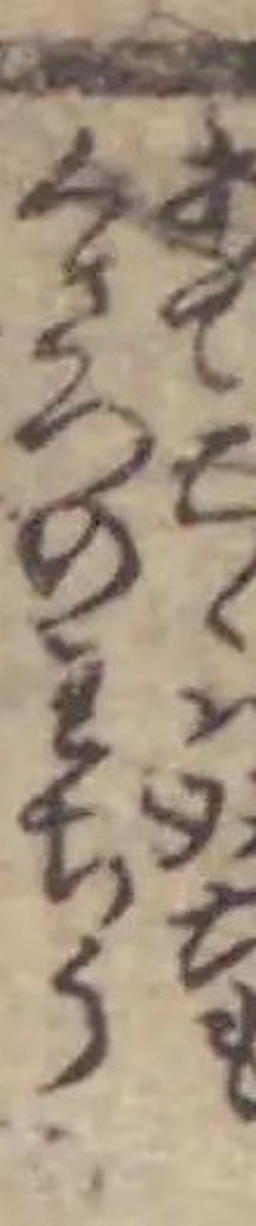くさつのちう
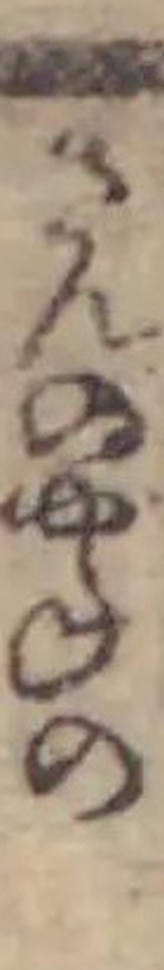さんのやねの
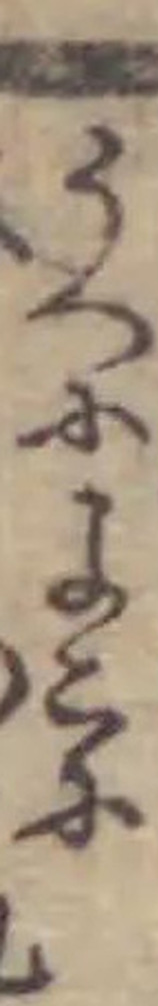うへによこに
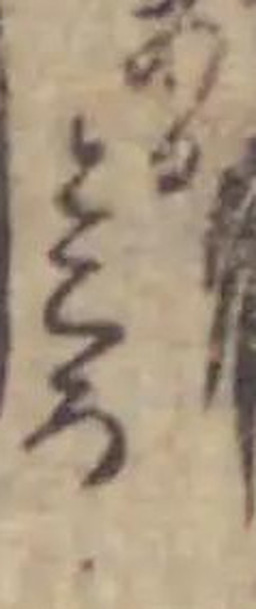ところ
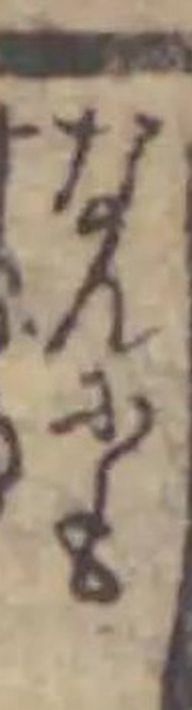なんにも
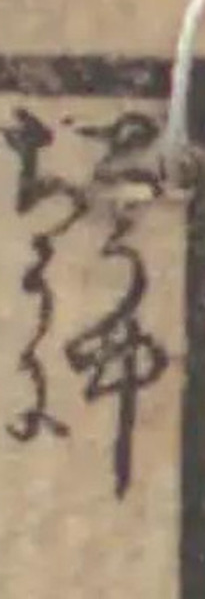ちうに
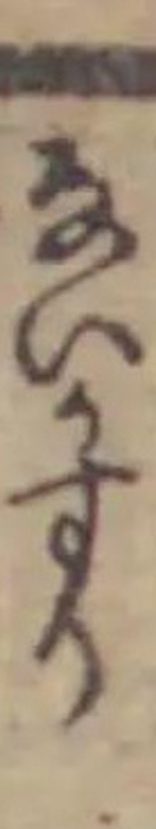ないかすり
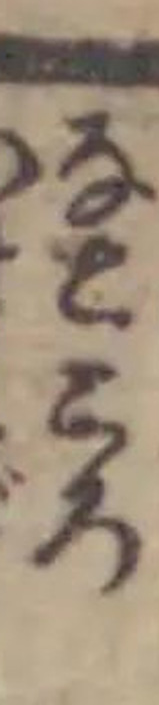なところ
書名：道笑双六
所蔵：国立国会図書館 National Diet Library, JAPAN
